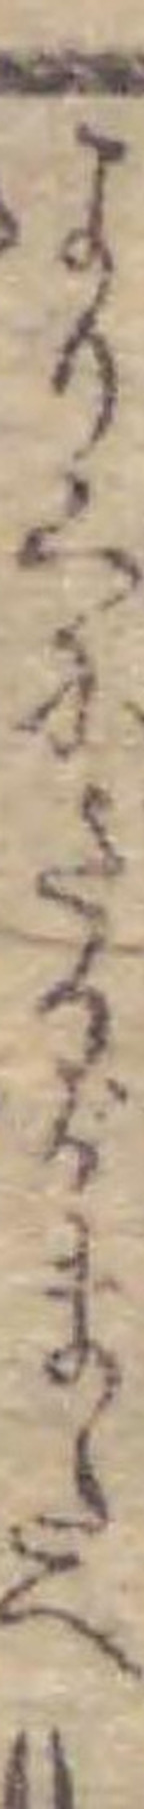よりくにざるがまたへ
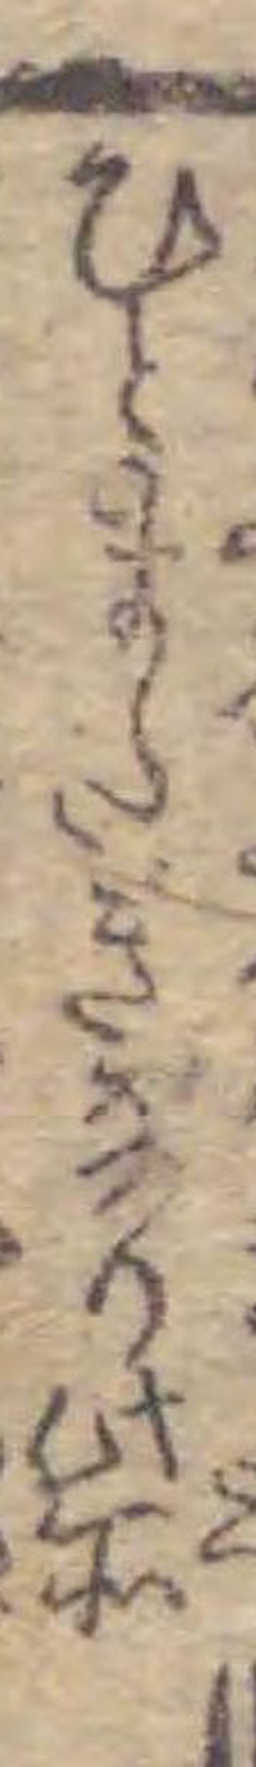ひとまたぎなり此所
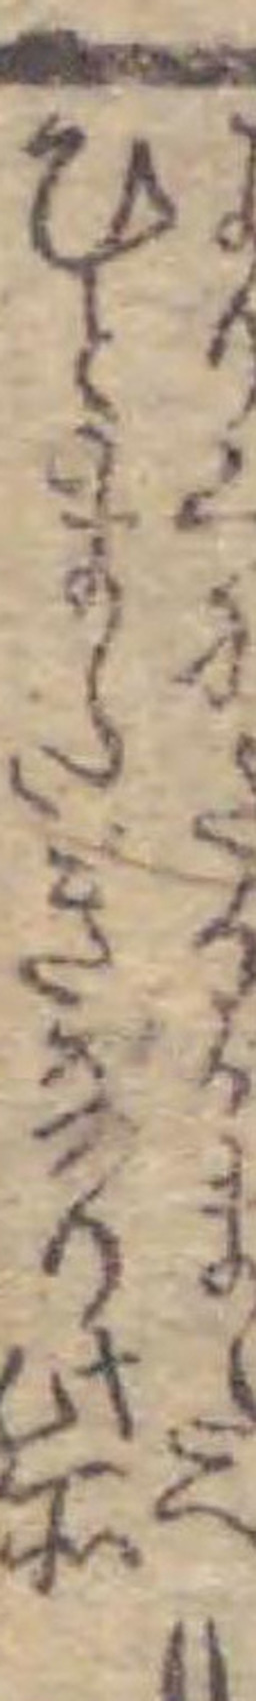ひとまたぎなり此所
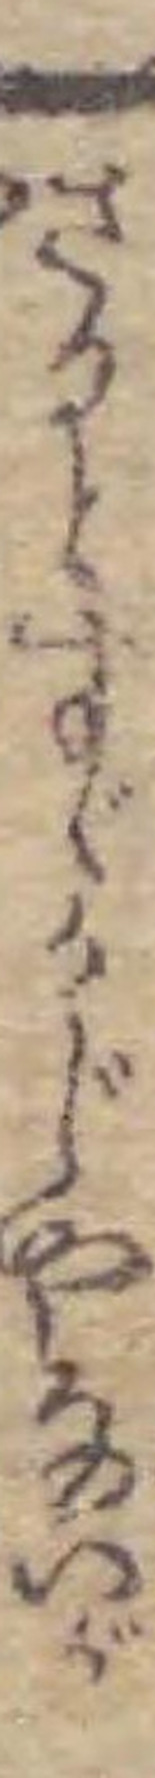さるとすゞかじやないが
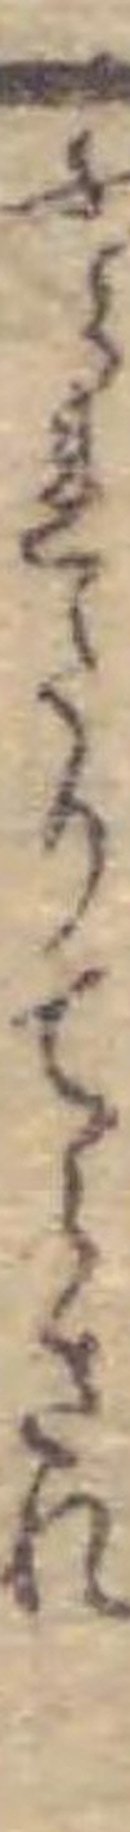ふられたりてらされ
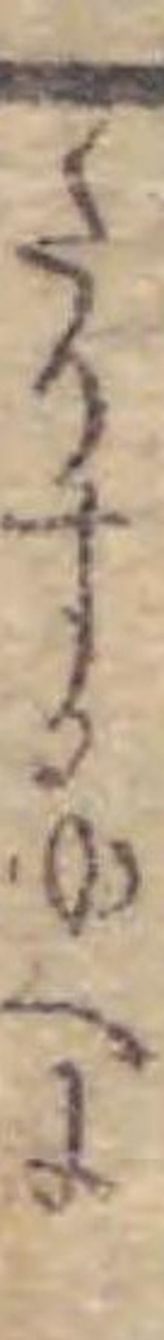たりするゆへに
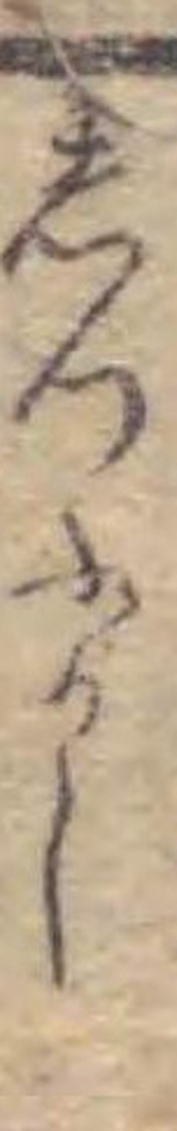しつふかし
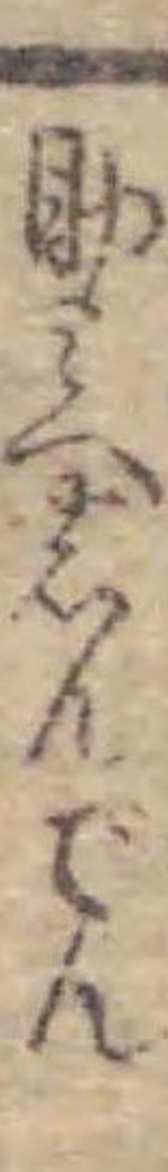助兵へしんでん
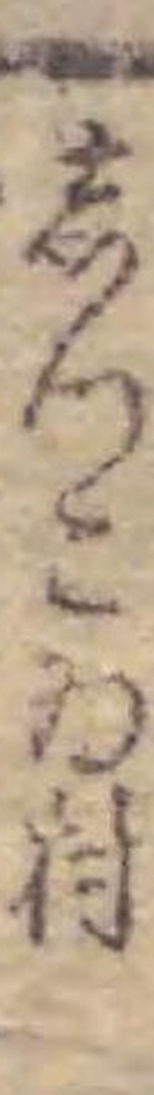しつこゐ村
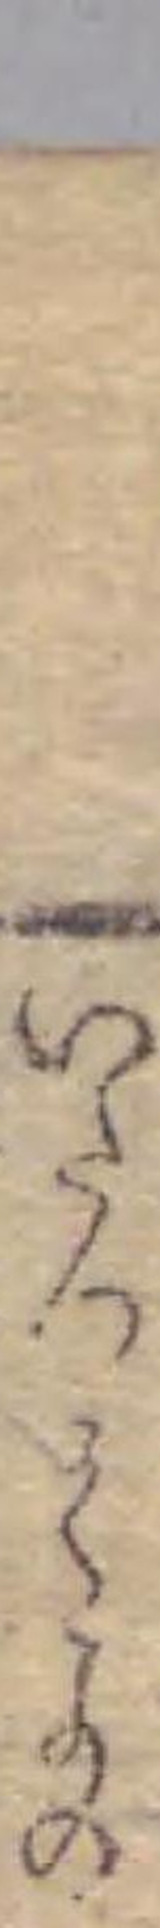いたつてよの
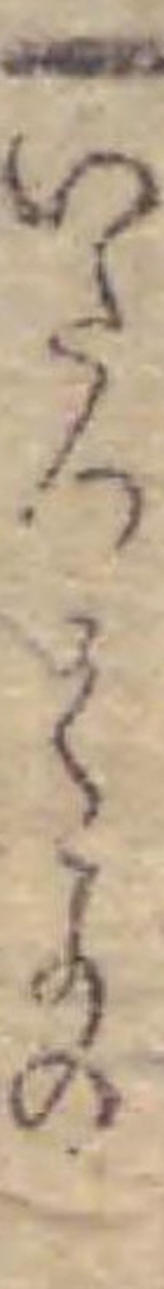いたつてよの
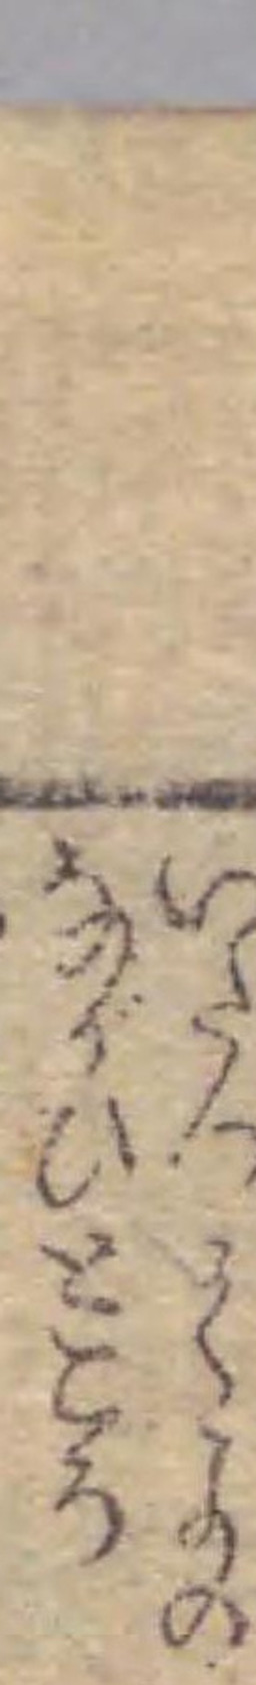ながひところ
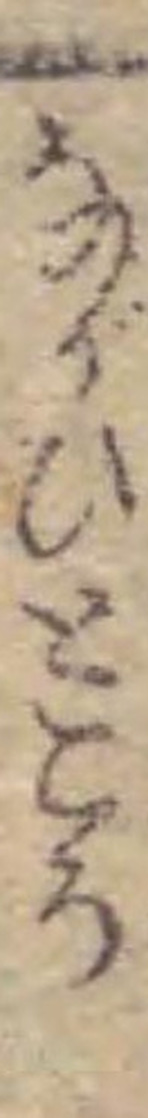ながひところ
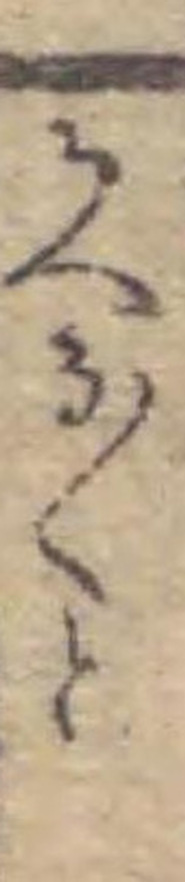かへる〳〵と
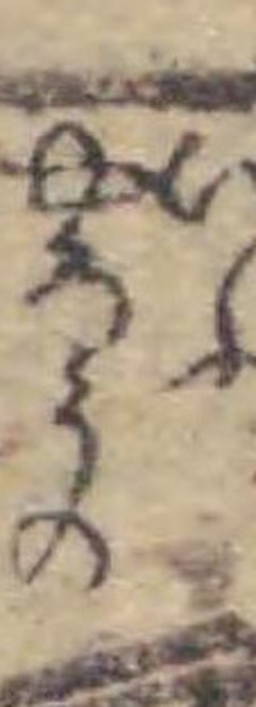やろうの
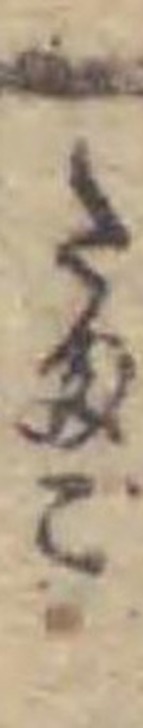たまご
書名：北国順礼唄方便 : 3巻
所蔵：国立国会図書館 National Diet Library, JAPAN
